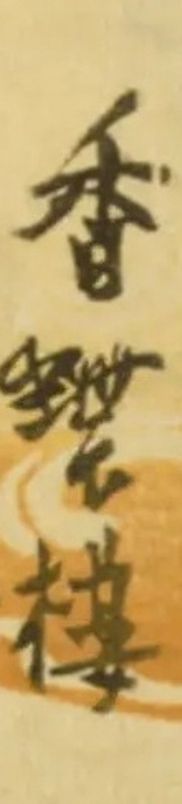香蝶棲
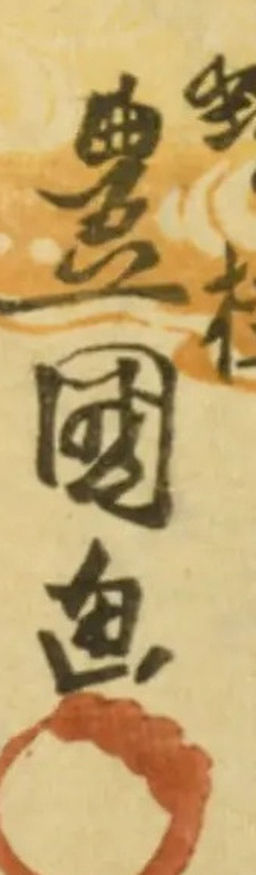豊国画
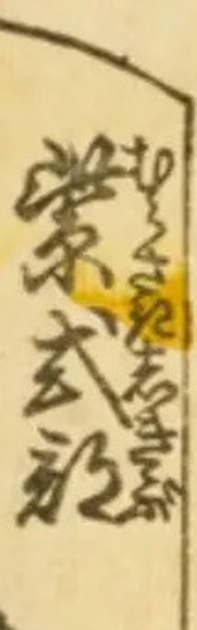紫式部
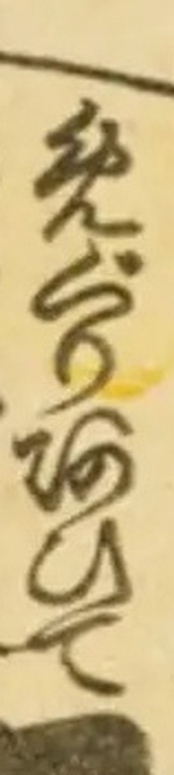めぐりあひて
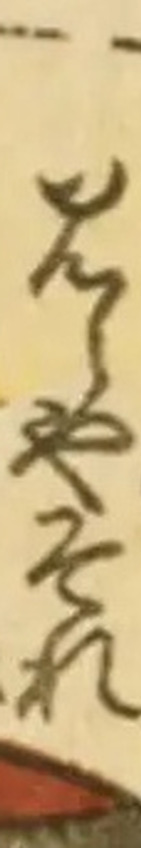見しやそれ
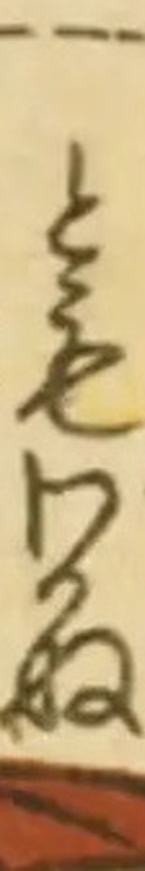ともわかぬ
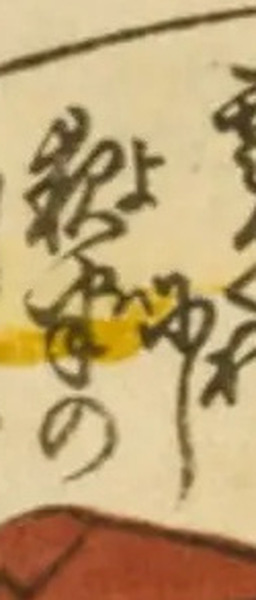夜半の
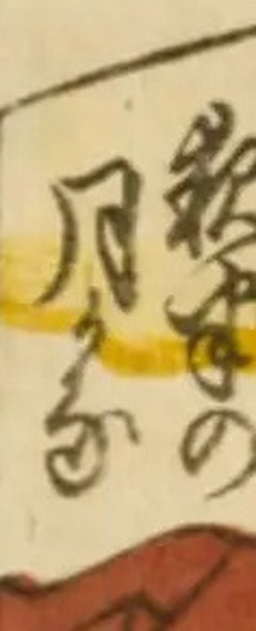月かな
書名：五十七番　紫式部
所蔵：国立国会図書館 National Diet Library, JAPAN
